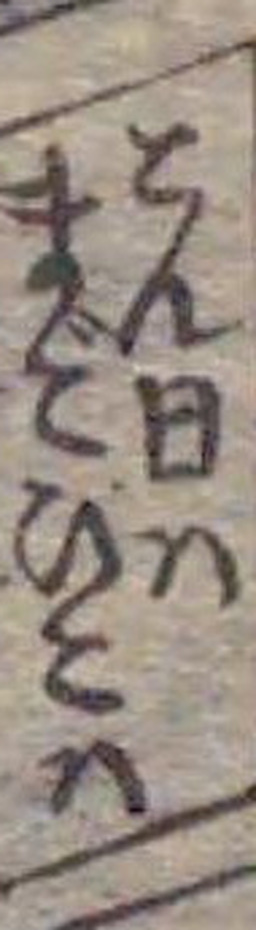まごひこは
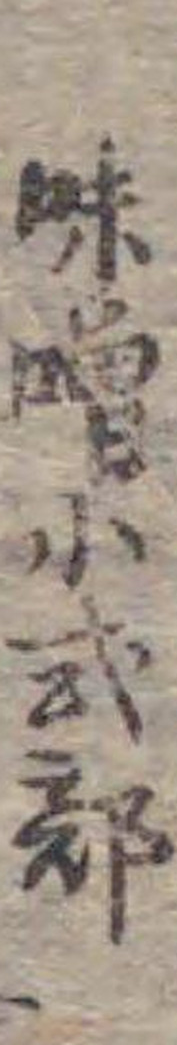味噌小式部
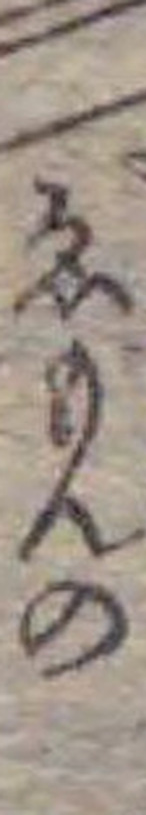ゑもんの
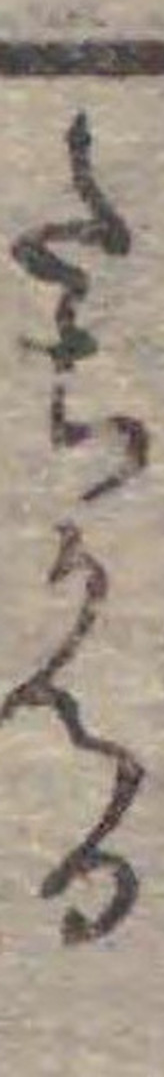たちかへる
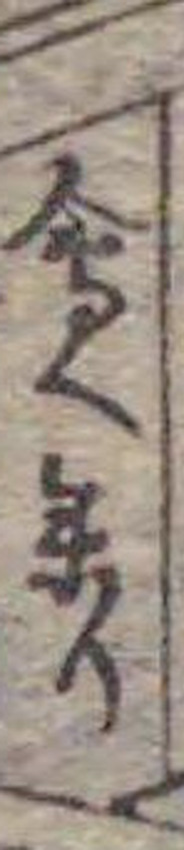会へ参り
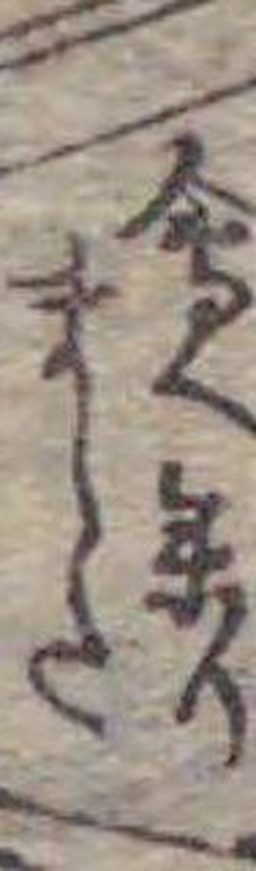ました
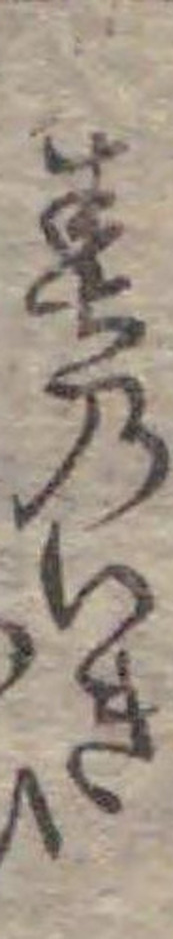春のいき
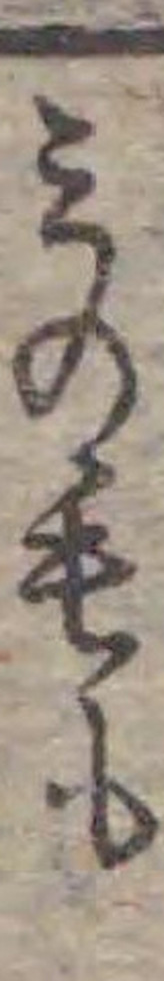みの毛も
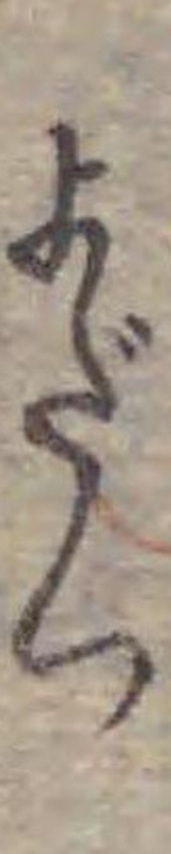よだつ
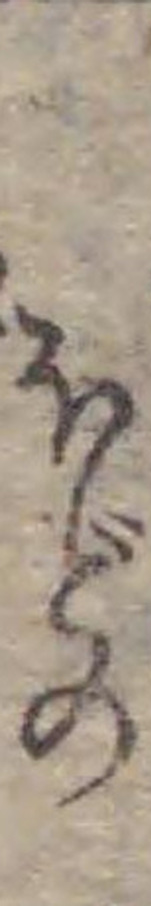ほどの
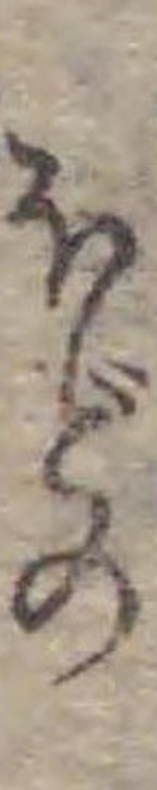ほどの

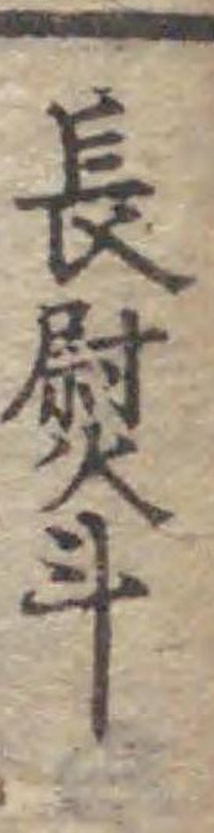長熨斗
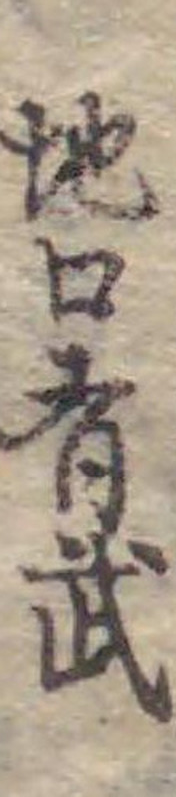地口有武
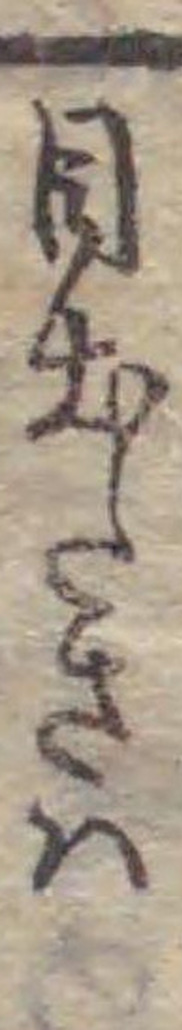目出たさは
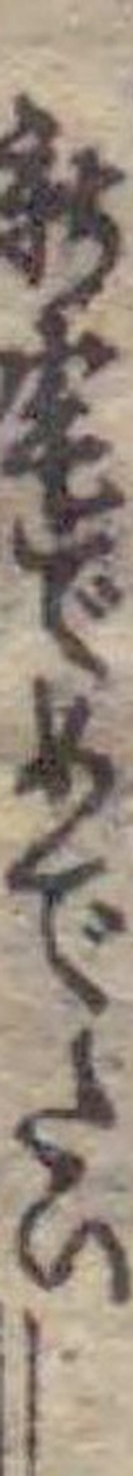新宅でめでたい
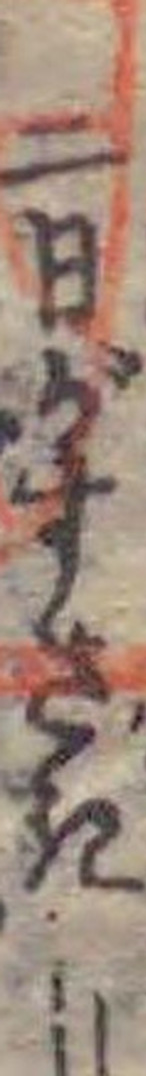二日がすさき
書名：年始御礼帳 : 3巻
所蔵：国立国会図書館 National Diet Library, JAPAN
